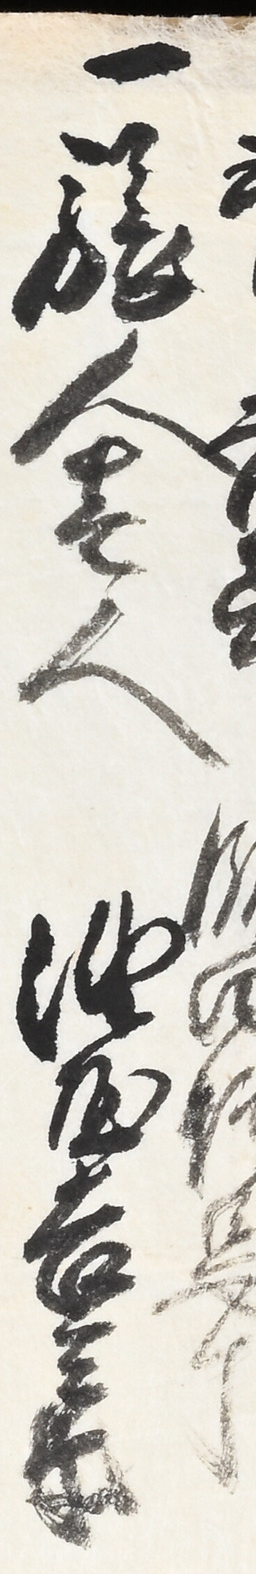一旅人壱人油屋吉兵衛
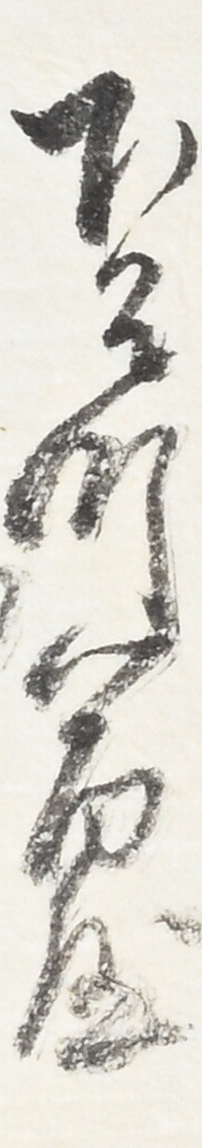下モ町冨屋
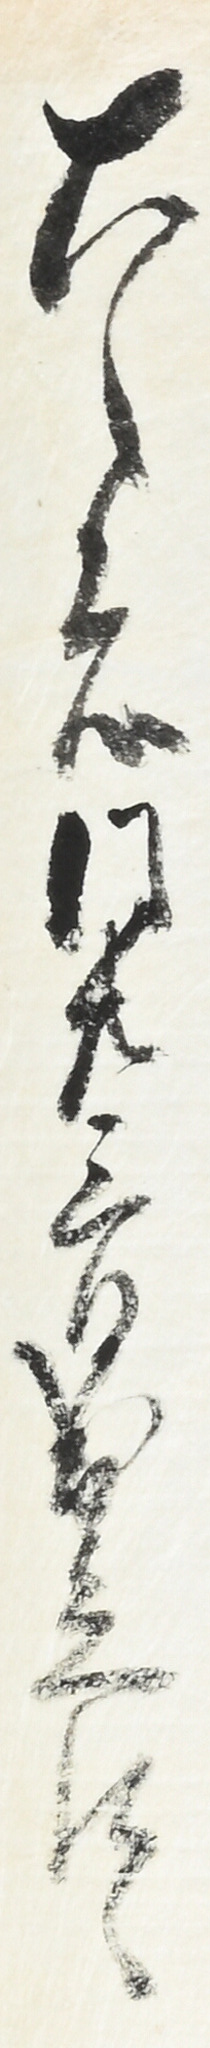右之者同廿三日出立仕候
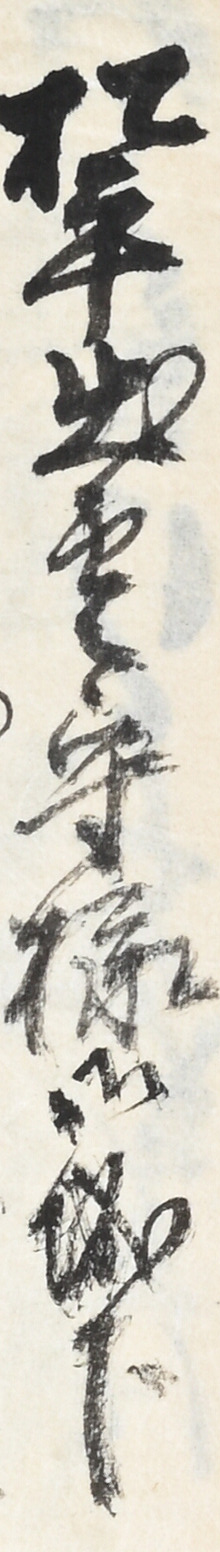松平丹波守様御城下
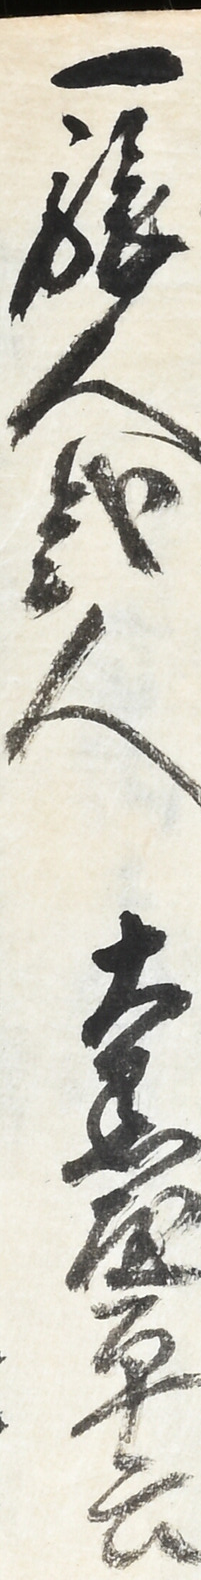一旅人壱人駕籠屋七兵衛

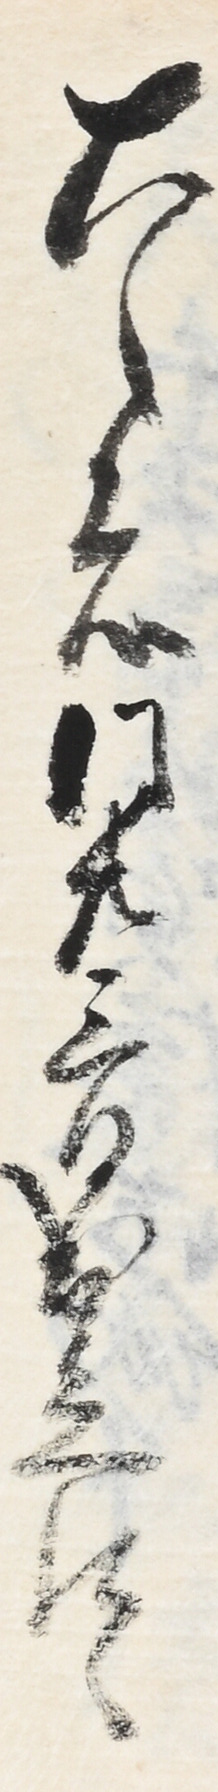右之者同十日出立仕候
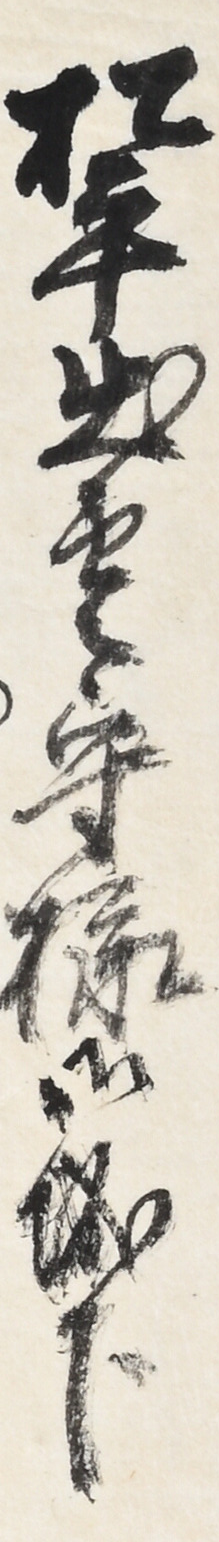松平出雲守様御城下
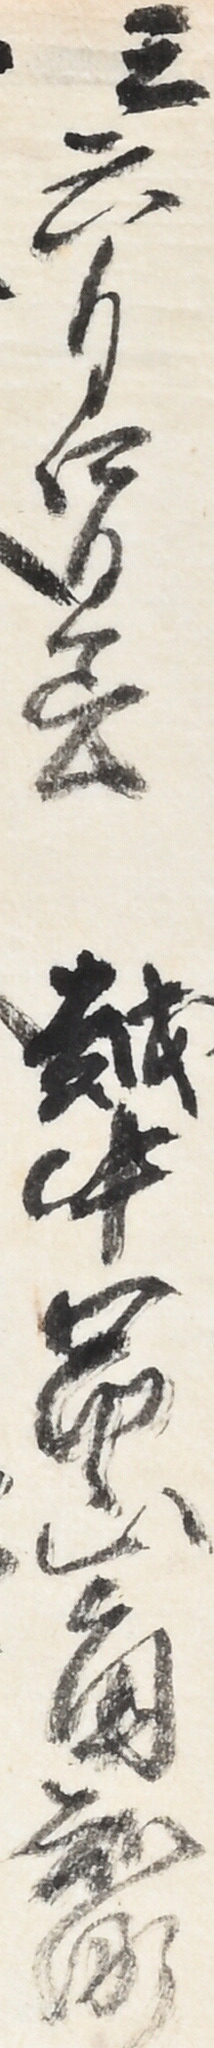壬六月四日着越中冨山角知町
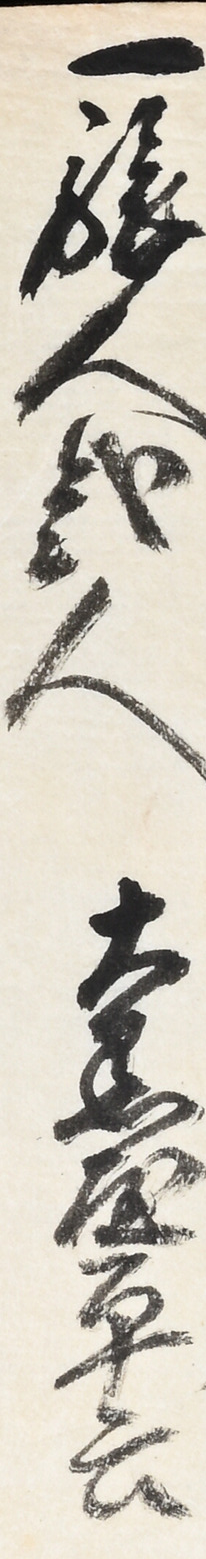一旅人弐人大黒屋平六
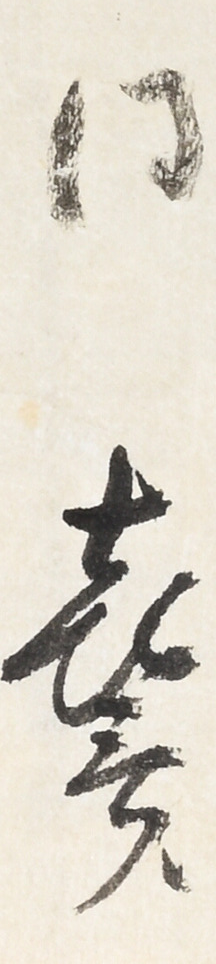同喜三郎
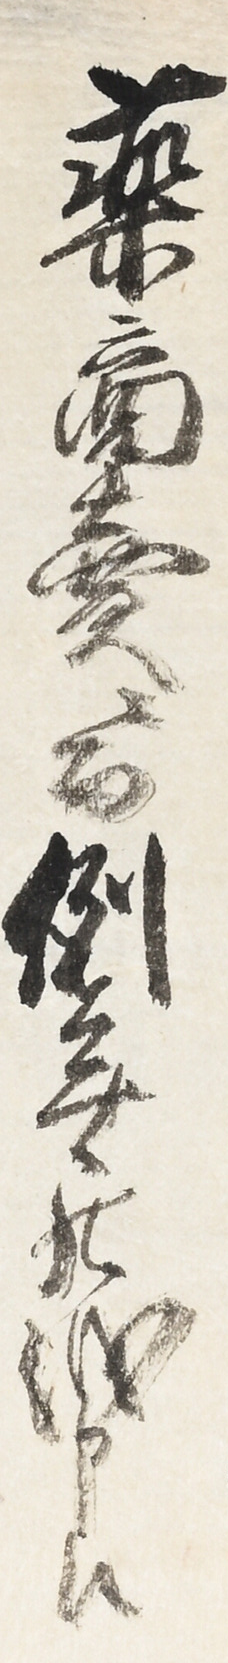薬商売ニ而例年罷越申候
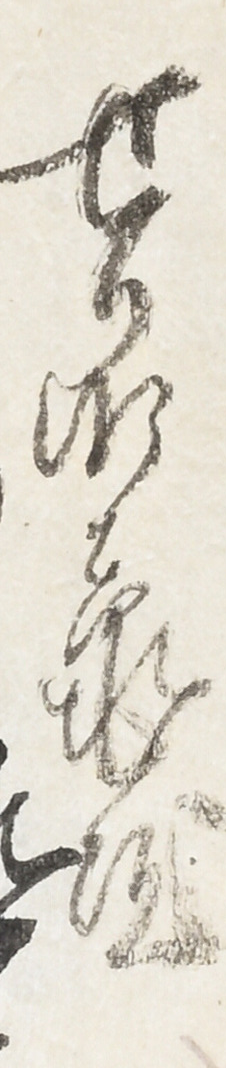せり町亀屋
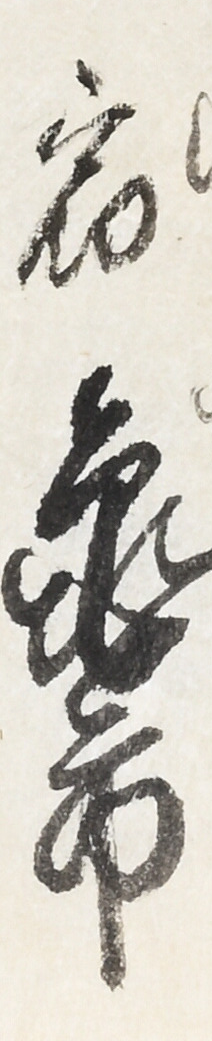宿亀市
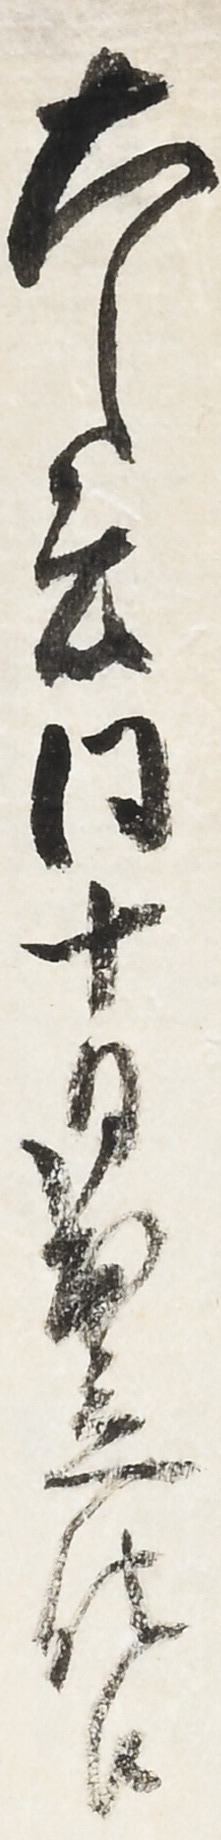右之者同十日出立仕候
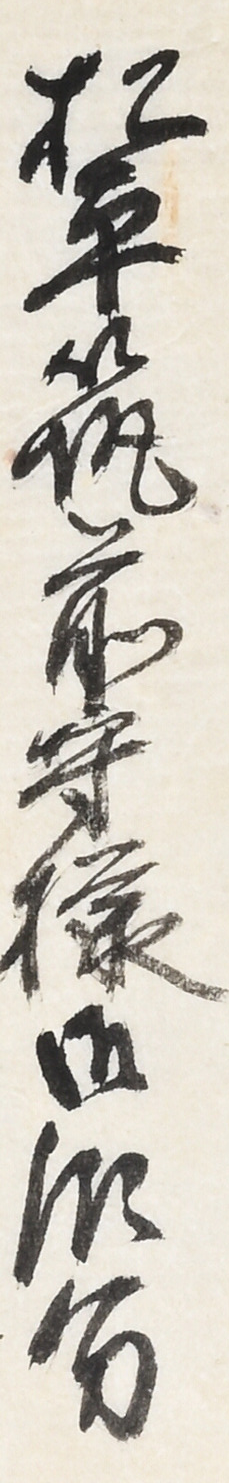松平筑前守様御領分
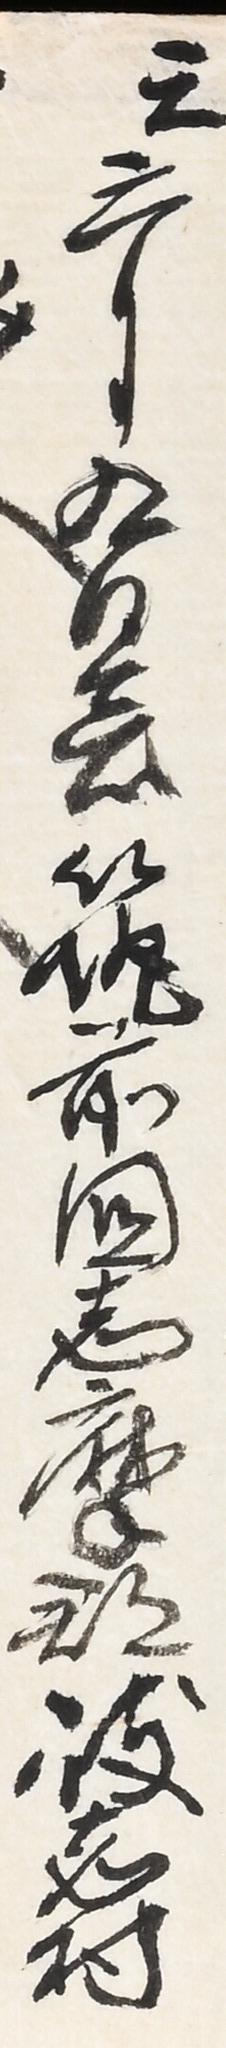壬六月九日着筑前国志摩郡岐志村
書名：旅人泊控帳
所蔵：伊那市立高遠町図書館・合同会社AMANE
